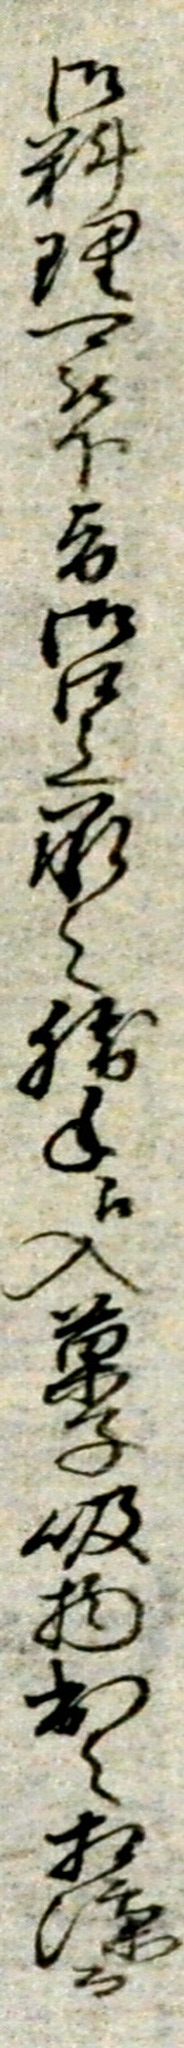御料理可被下旨御口上承之勝手江入菓子吸物出之相済而
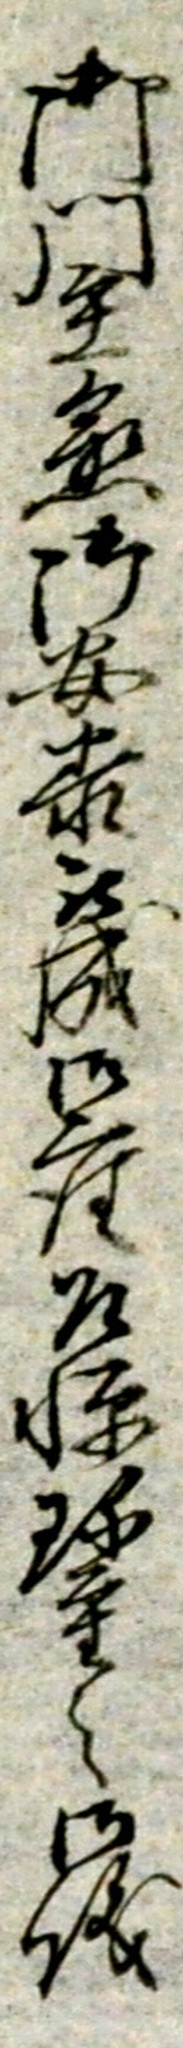御門主愈御安泰被成御座乍憚珎重之御儀
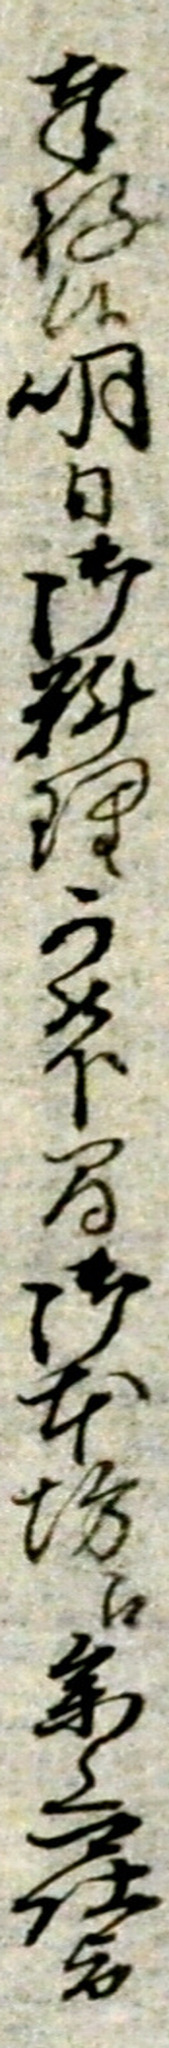奉存候明日御料理可被下間御本坊江参上可仕旨
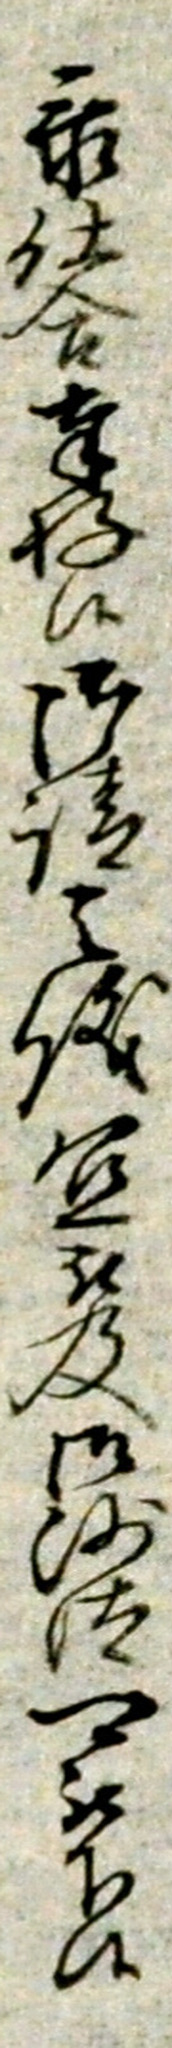忝仕合奉存候御請之儀宜被及御沙汰可被下候
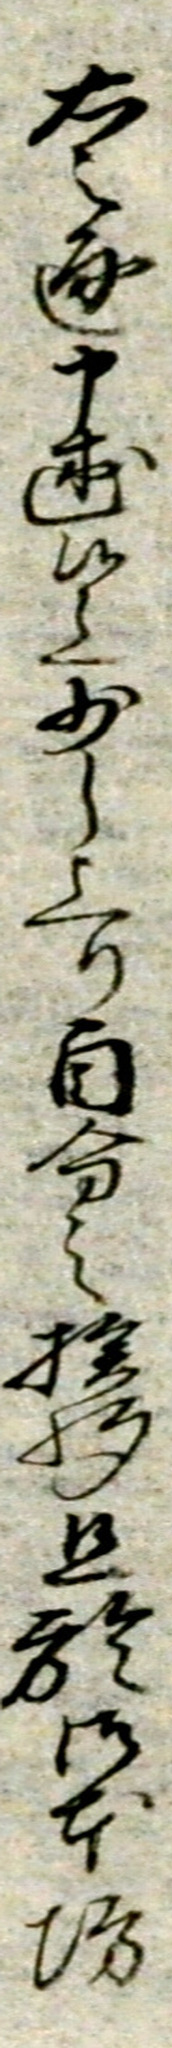右之通申述候上少し上り自分之挨拶且於御本坊
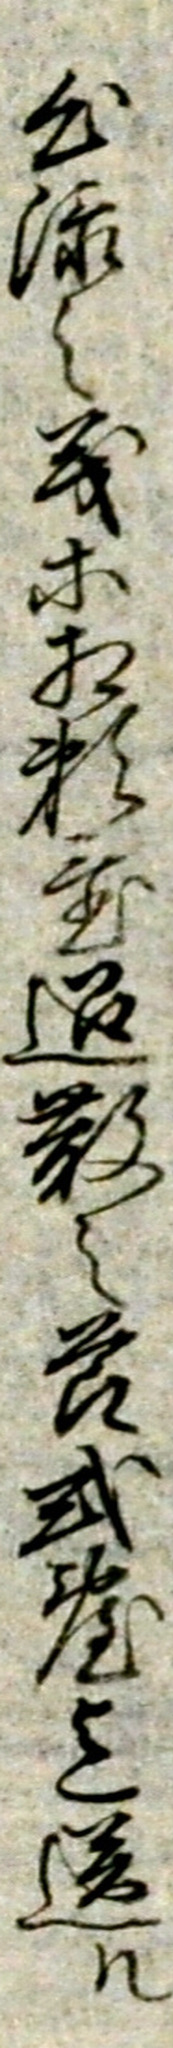心添之義等相頼置退散之節式台迄送ル
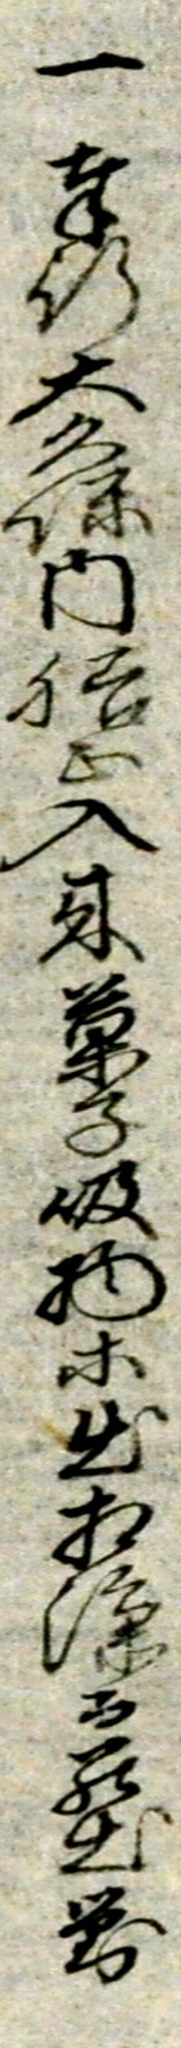一奉行大久保内膳正入来菓子吸物等出相済而罷出対
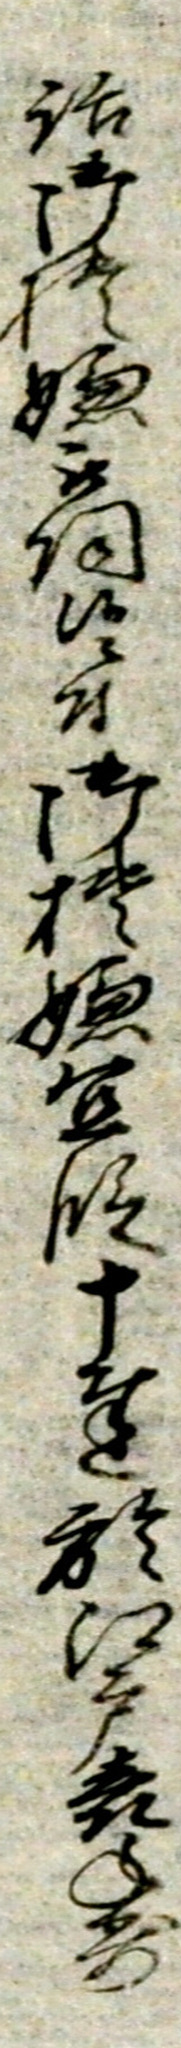話御機嫌被伺候ニ付御機嫌宜段申達於江戸表年寄
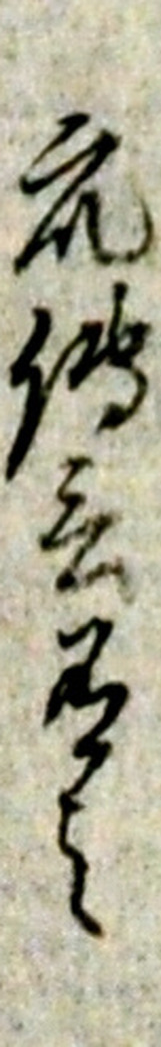衆伝言有之
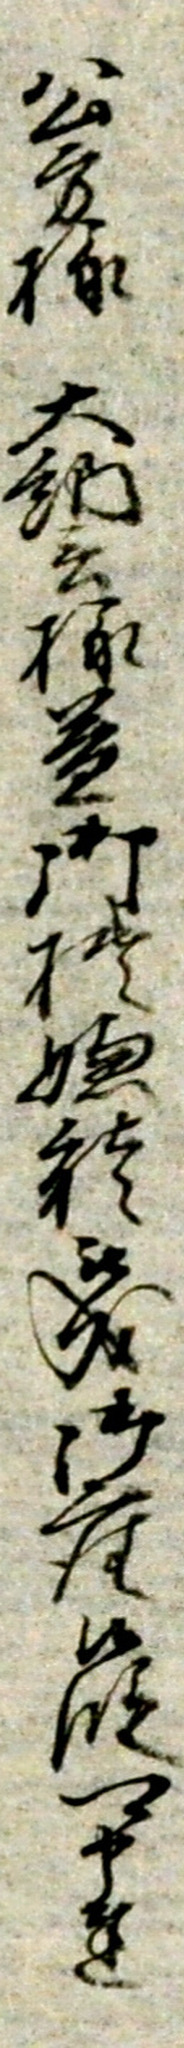公方様大納言様益御機嫌能被成御座候段可申達
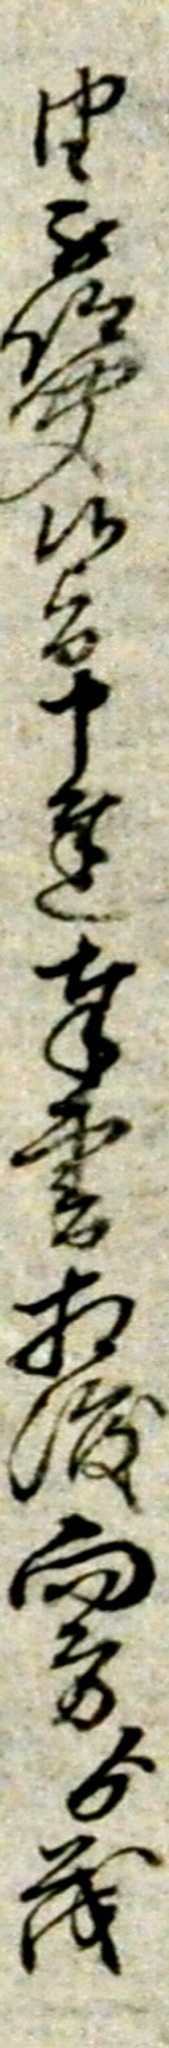由被仰聞候旨申達奉書相渡向方ゟも
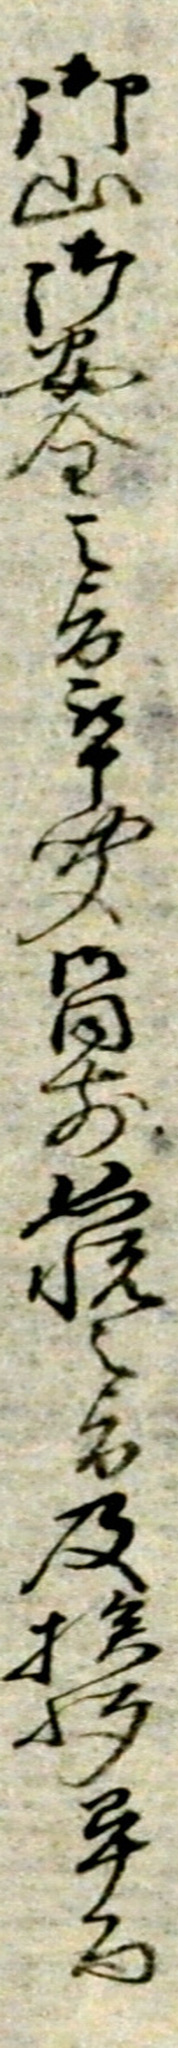御山御安全之旨被申聞御同前恐悦之旨及挨拶畢而
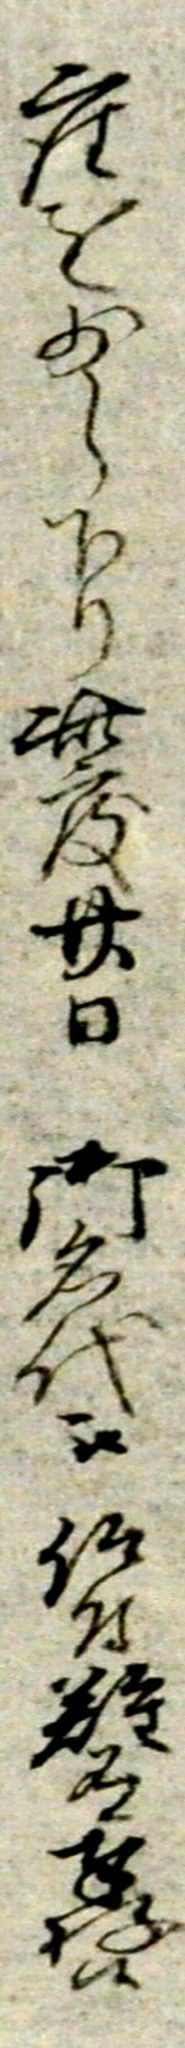座を少し下り此度廿日御名代被仰付難有奉存候
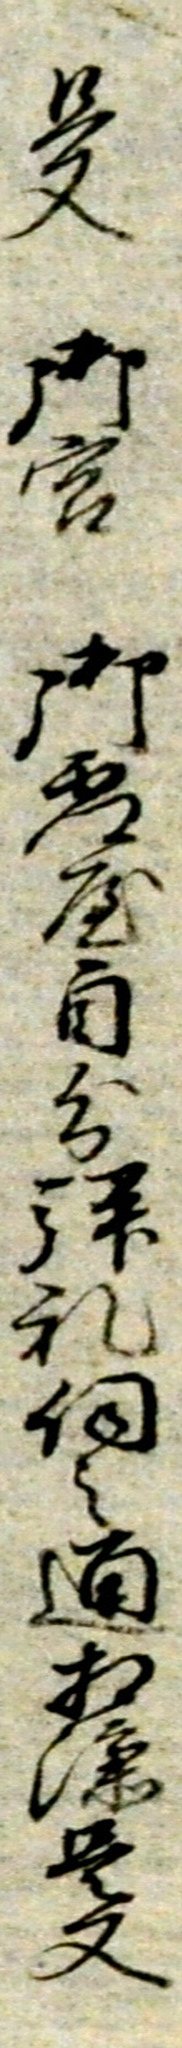且又御宮御霊屋自分拝礼伺之通相済是又
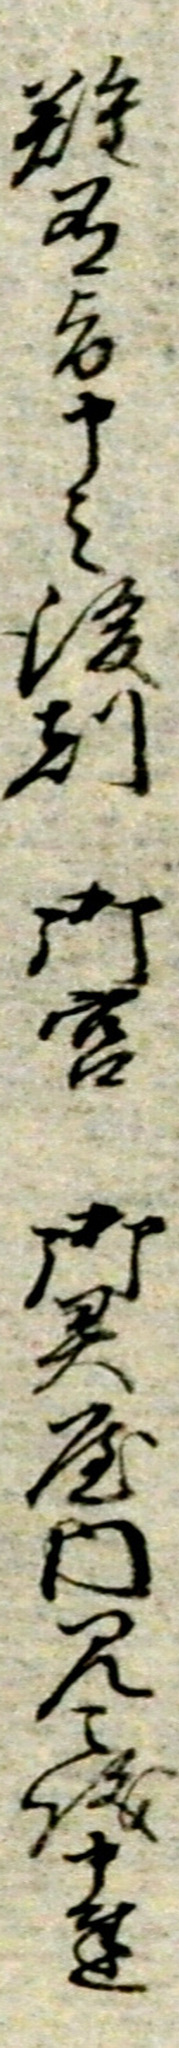難有旨申之後刻御宮御霊屋内見之儀申達
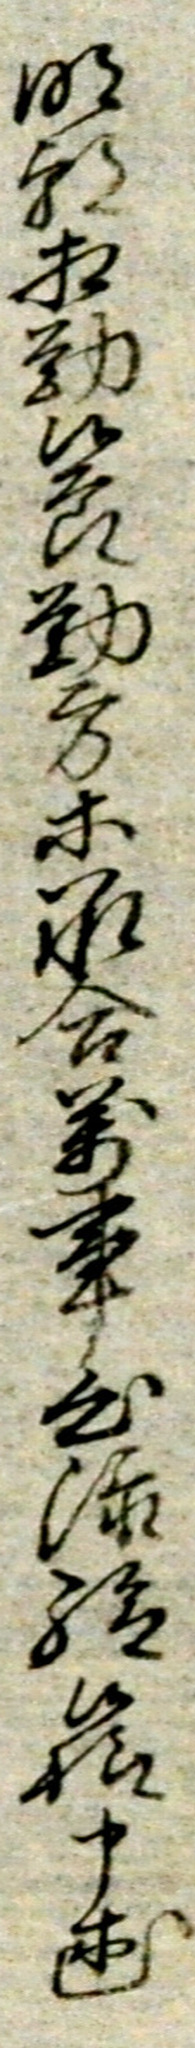明朝相勤候節勤方等承合万事心添給候様申述
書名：日光御名代相勤候節ノ留
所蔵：伊那市立高遠町図書館・合同会社AMANE
